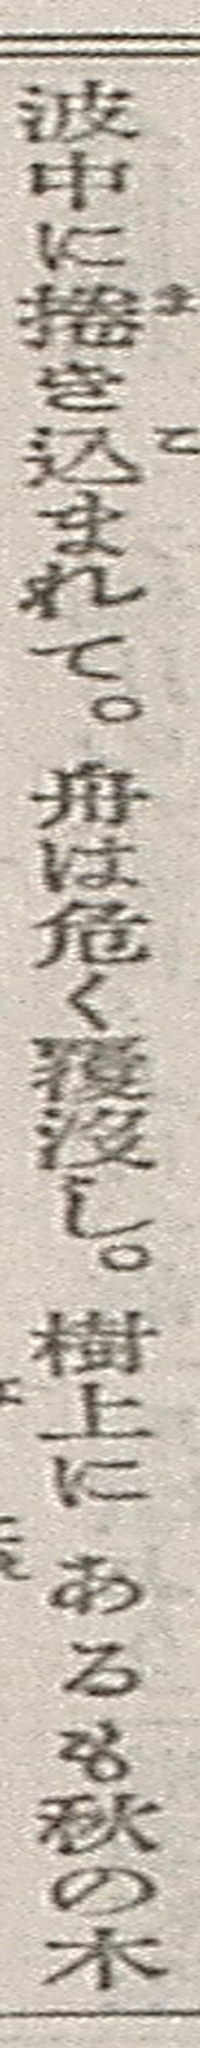波中に捲き込まれて。舟は危く覆没し。樹上にあるも秋の木
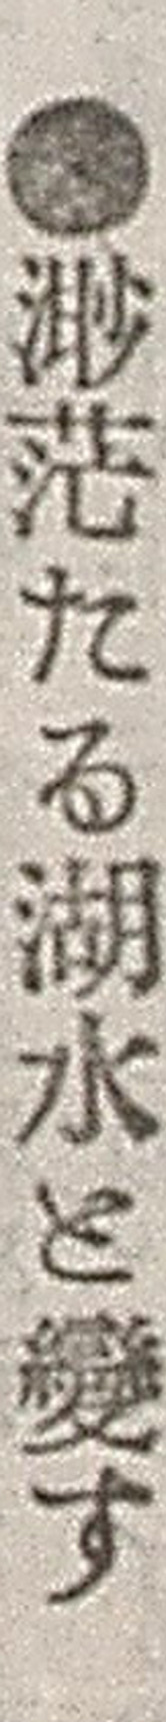●渺茫たる湖水と変す
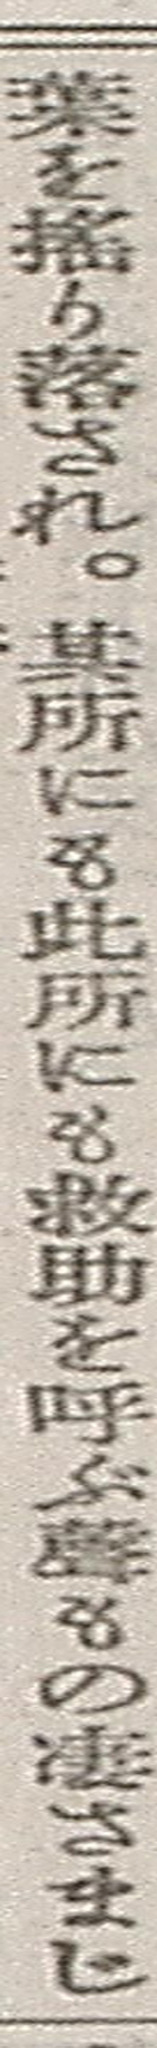葉を揺り落され。其所にも此所にも救助を呼ぶ声もの凄さまじ
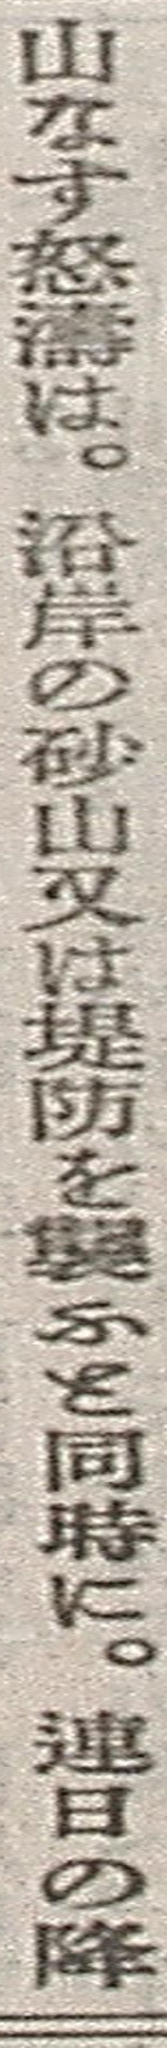山なす怒濤は。沿岸の砂山又は堤防を襲ふと同時に。連日の降
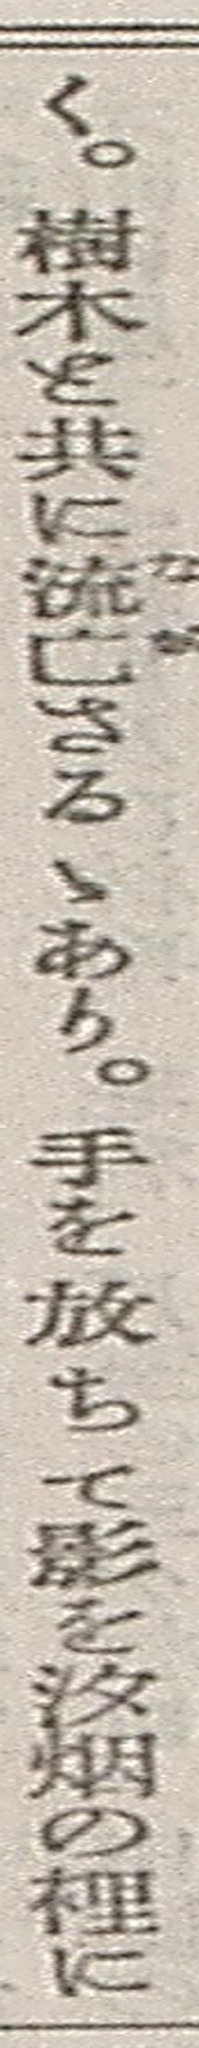く。樹木と共に流亡さるゝあり。手を放ちて影を汐烟の裡に
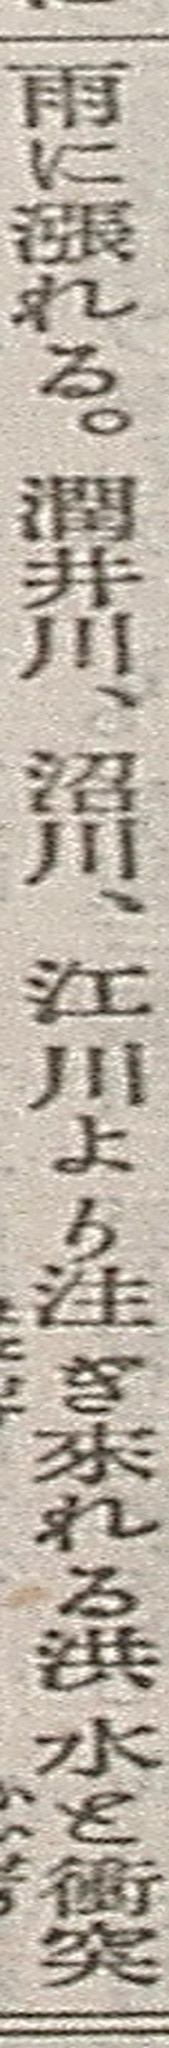雨に漲れる。潤井川、沼川、江川より注ぎ来れる洪水と衝突
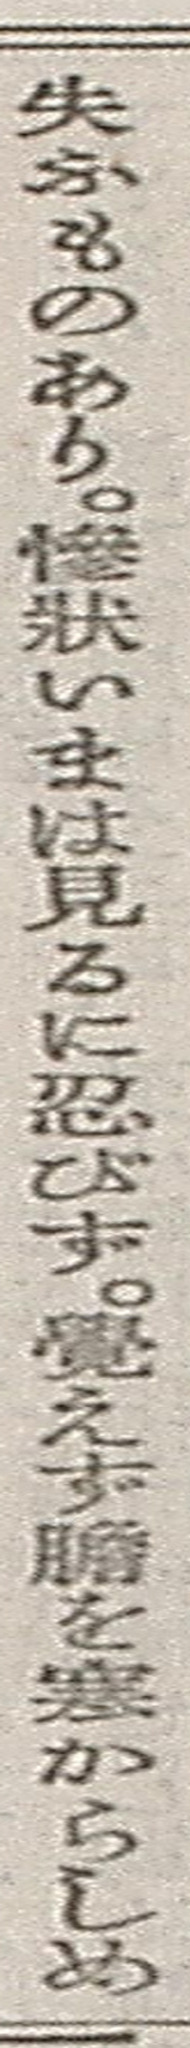失ふものあり。惨状いまは見るに忍びず。覚えず臍を寒からしめ
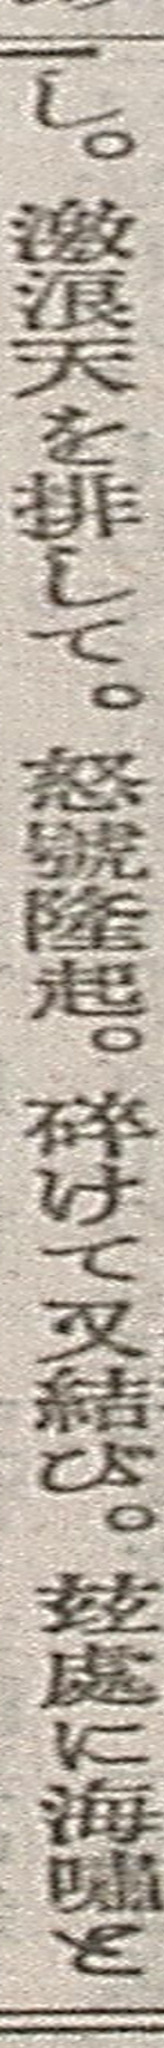し。激浪天を排して。怒号隆起。砕けて又結び。茲処に海嘯と
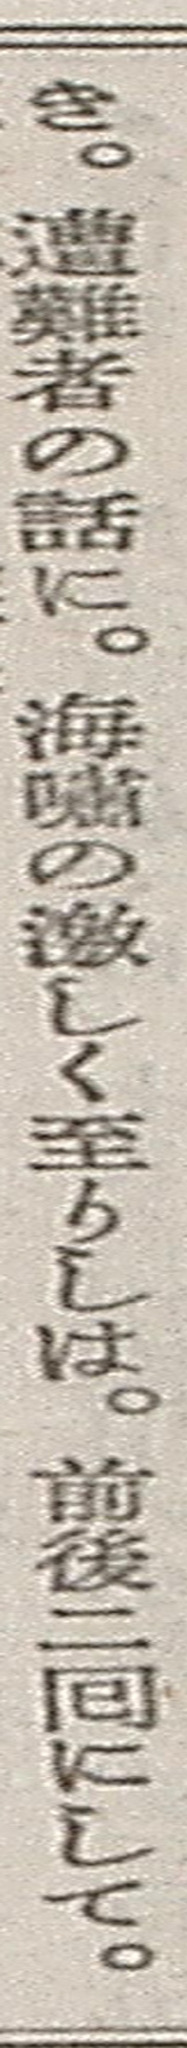き。遭難者の話に。海嘯の激しく至りしは。前後二回にして。
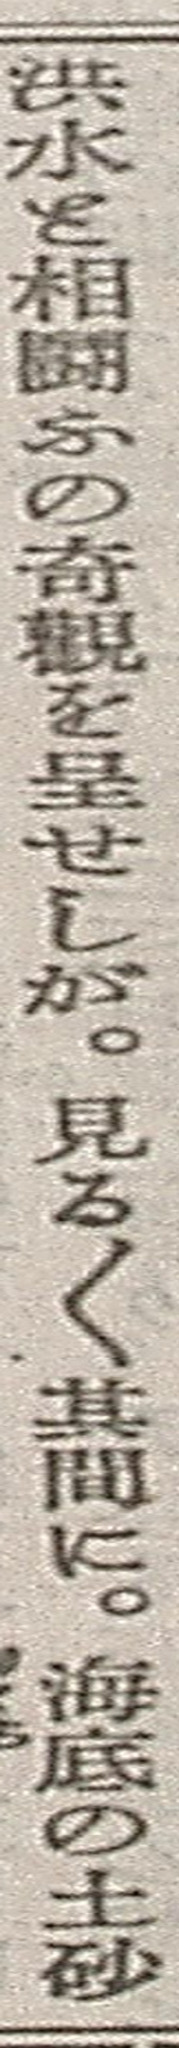洪水と相闘ふの奇観を呈せしが。見る〳〵其間に。海底の土砂
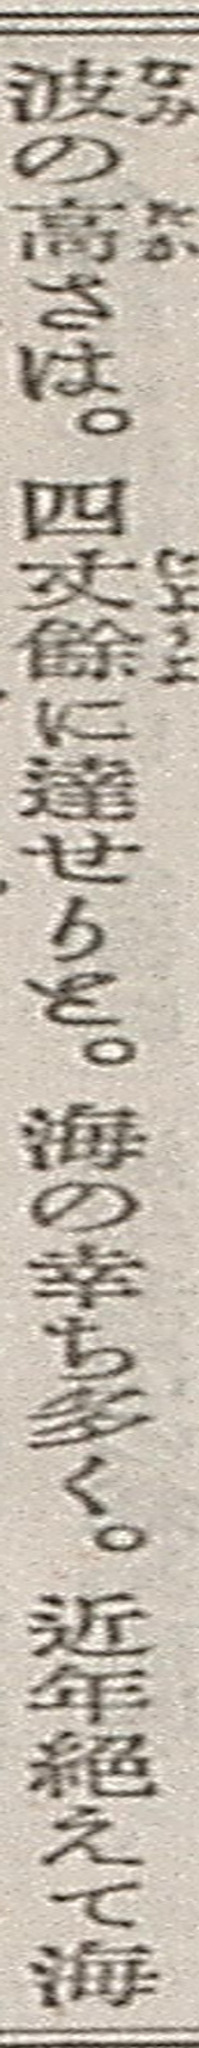波の高さは。四丈余に達せりと。海の幸ち多く。近年絶えて海
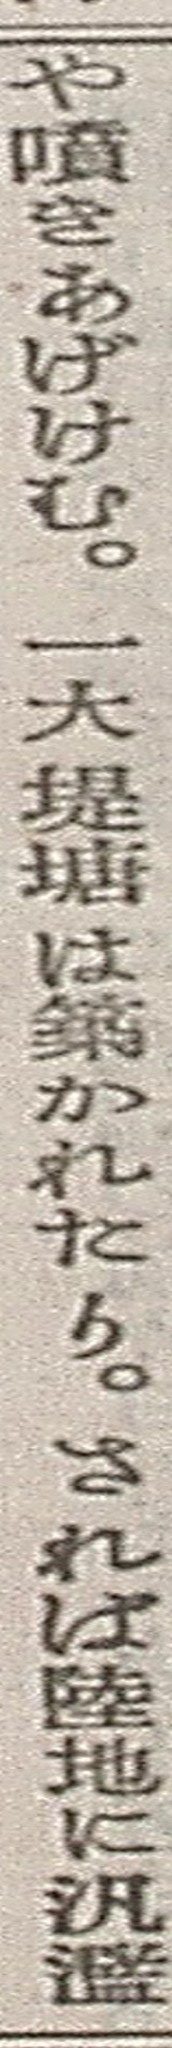や噴きあげけむ。一大堤塘は築かれたり。されば陸地に汎濫
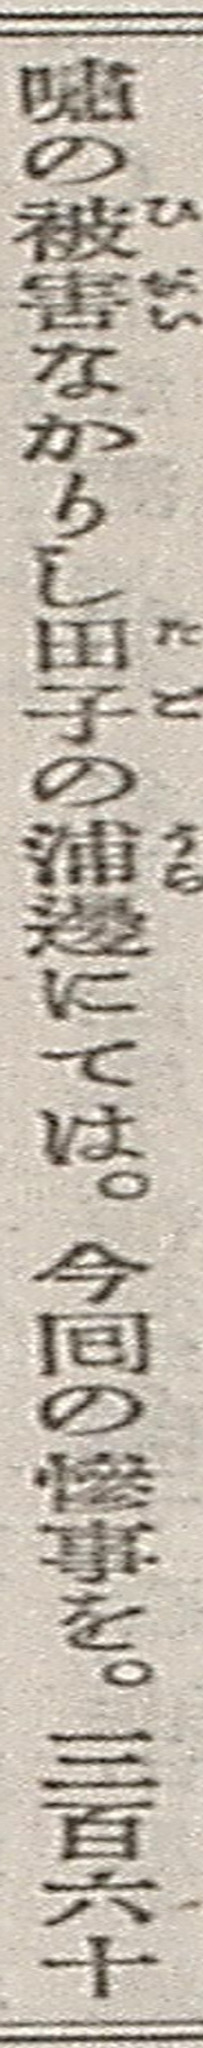嘯の被害なかりし田子の浦辺にては。今回の惨事を。三百六十
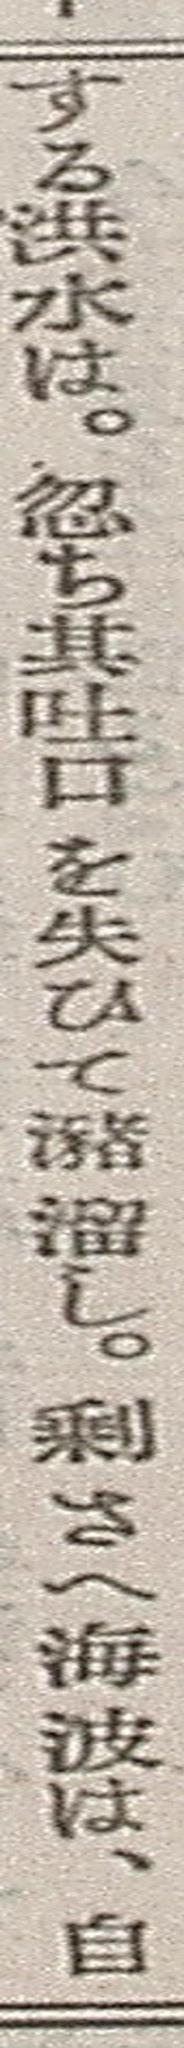する洪水は。忽ち其吐口を失ひて瀦溜し。剰さへ海波は、自
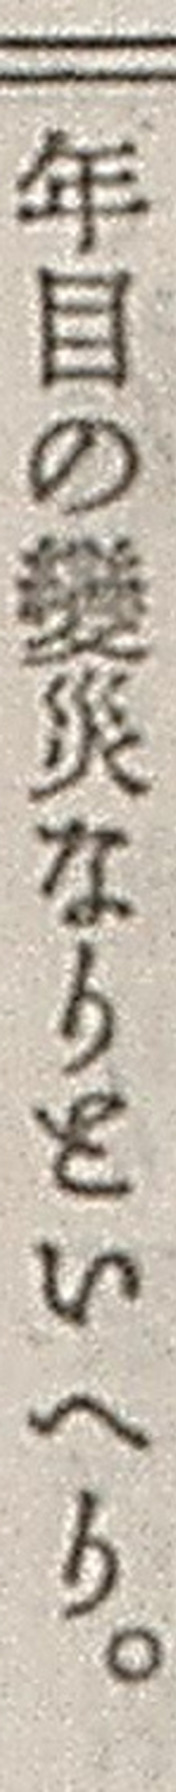年目の変災なりといへり。
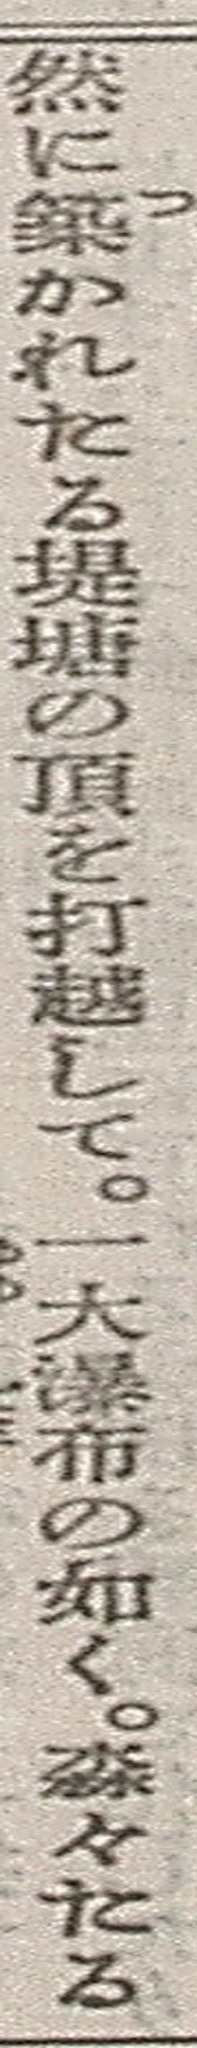然に築かれたる堤塘の頂を打越して。一大瀑布の如く。淼々たる
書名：風俗畫報臨時増刊第百九十九號　明治三十二年十月各地災害圖會（前編之續）
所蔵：東京大学地震研究所図書室 Earthquake Research Institute Library, The University of Tokyo, JAPAN
